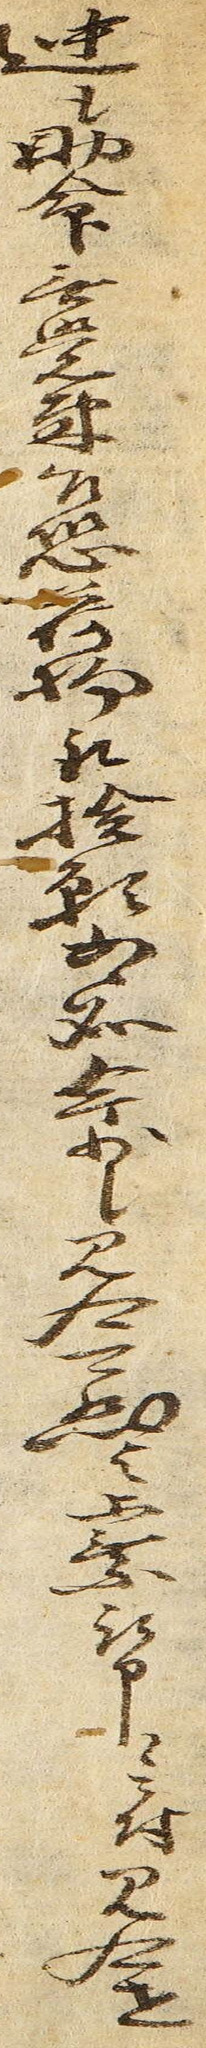迚も助命無覚束乍恐荷物取捨願出候処今少し見合可然と上乗被申候に付見合せ
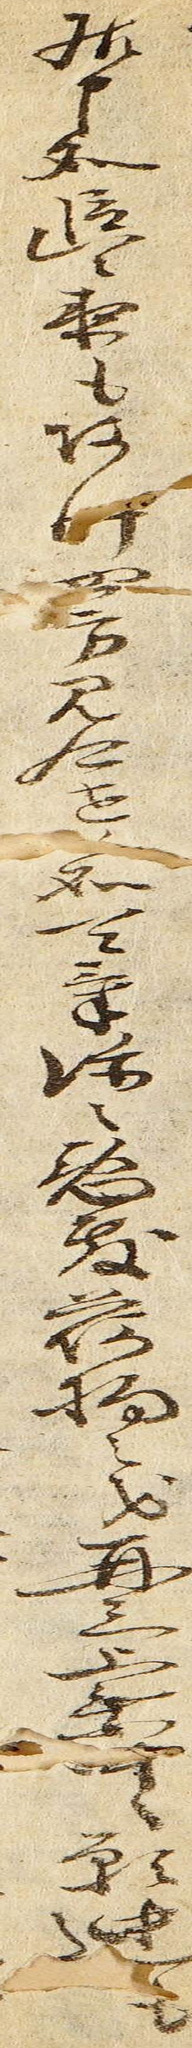居申処追々夜もあけ四方見合せ候処天気弥々悪敷荷物之義再三上乗中へ願迚も
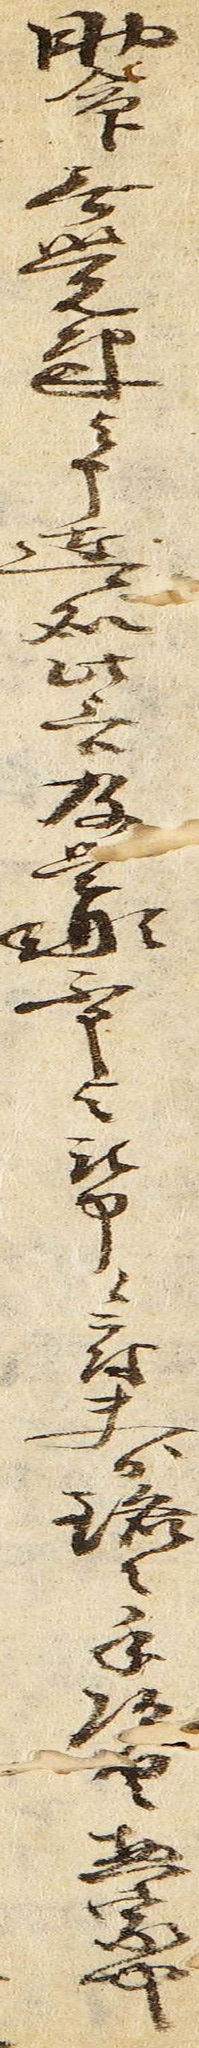助命無覚束と申達候処此上は及是非不申と被申候に付夫ゟ銘々手次く惣家中
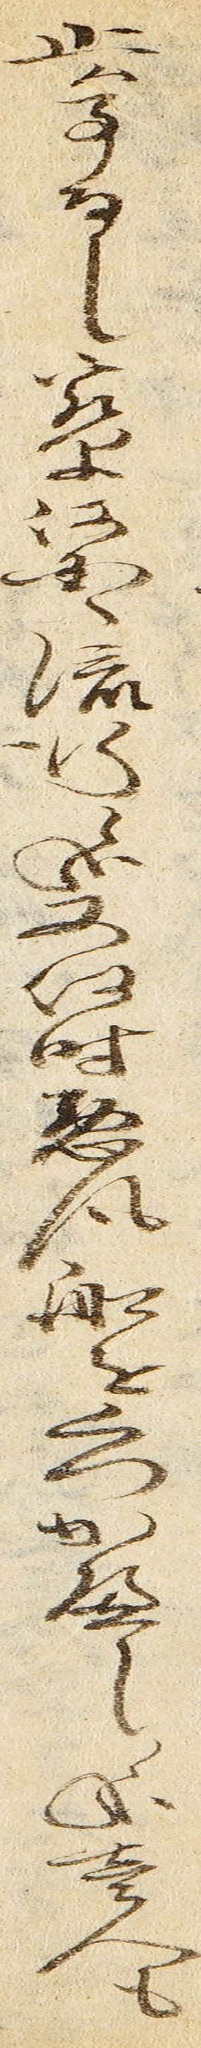止む事なし最早何国へ流行候哉又何時悪風船をくつかへし候哉壱人も
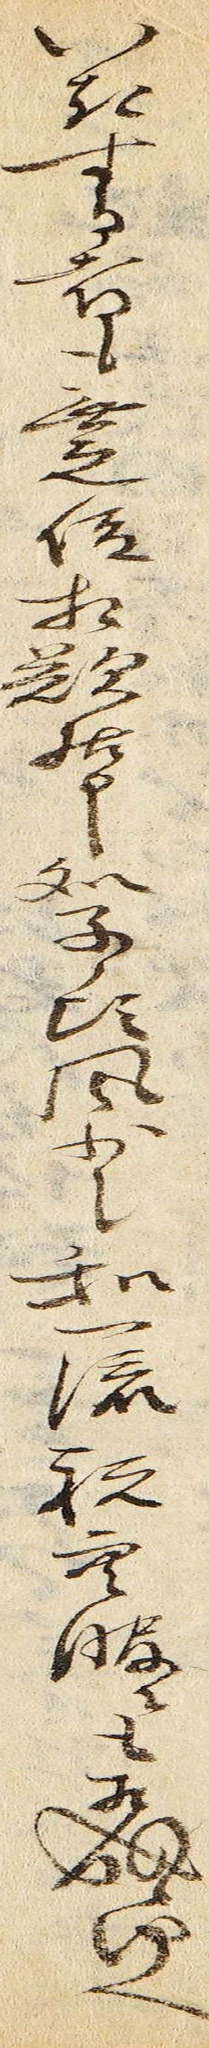いきする者も無之位相歎居申処子の頃風少し和一流祝空服にも相成候ゆへ
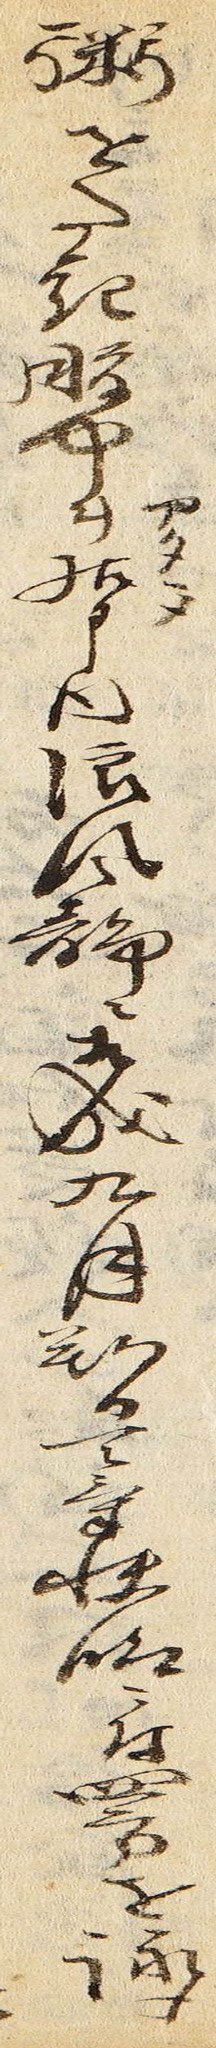粥をたき腹中をあたため居申内浪風静に相成九月朔日天気快晴に付四方を詠め
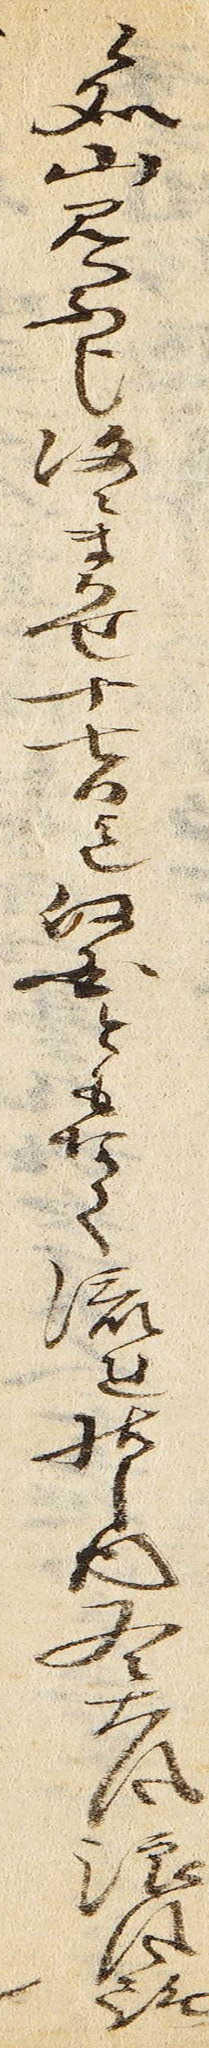候処山見へ不申候汐にまかせ十七日迄何国ともなく流れ居候内又々大風浪風強
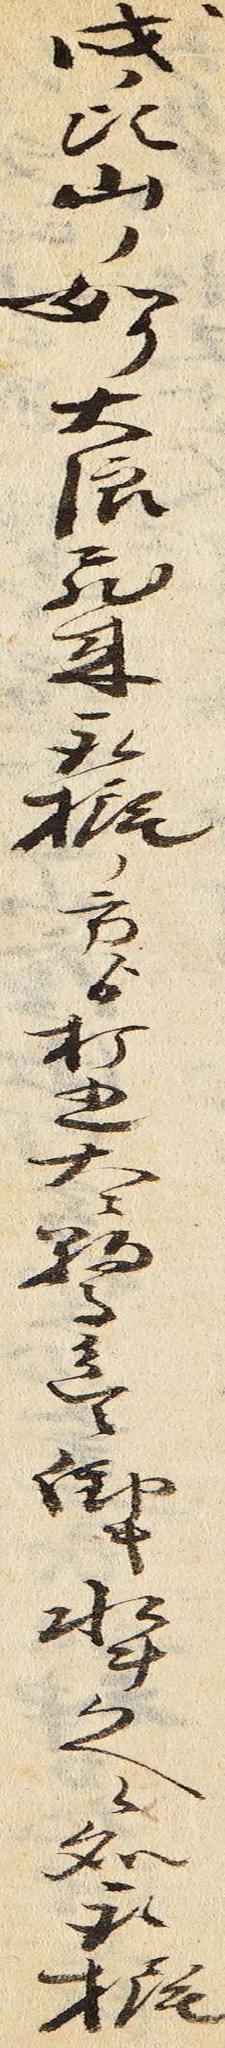戌の頃山の如く大浪飛来取梶の方ゟ折れ大に驚色々働き水をかへ候処取梶
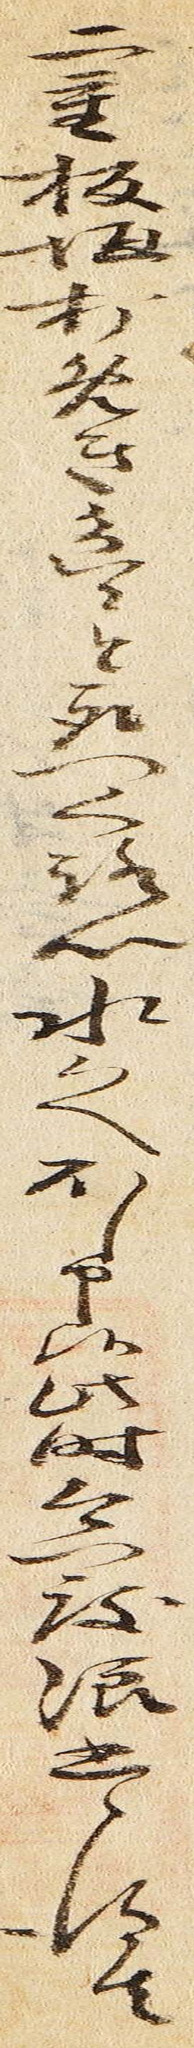二重板垣打めき色々と取つくろい水かへほし申候此時今一度浪出候得者
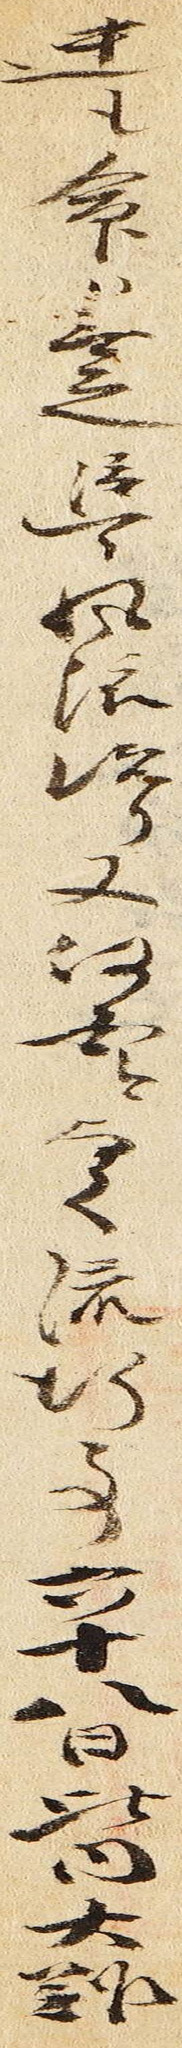迚も命は無之追々風浪治り又何国となく流行事六十八日此内大難
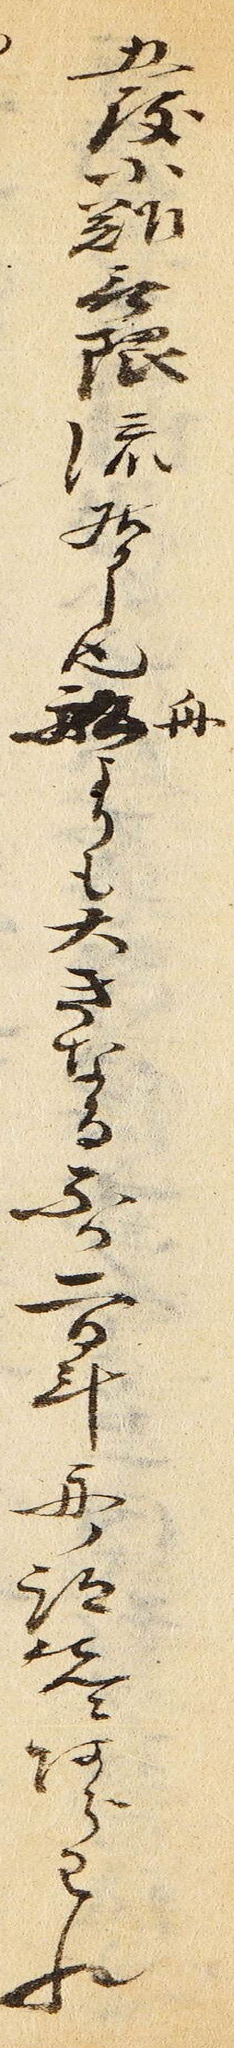五度小難無限流居申内舟よりも大きなるふか二日計舟の跡先にあらわれ
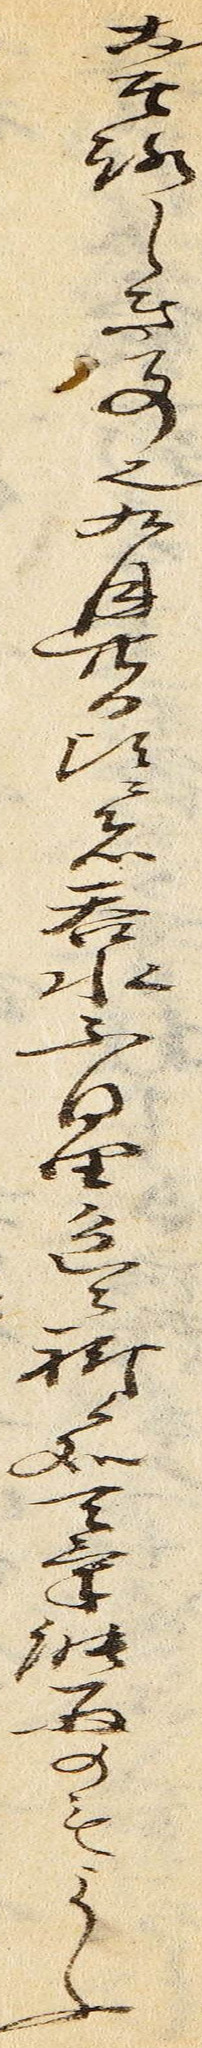おそろしき事也九月廿日頃には呑水不自由色々祈候処天気能雨のもよふ
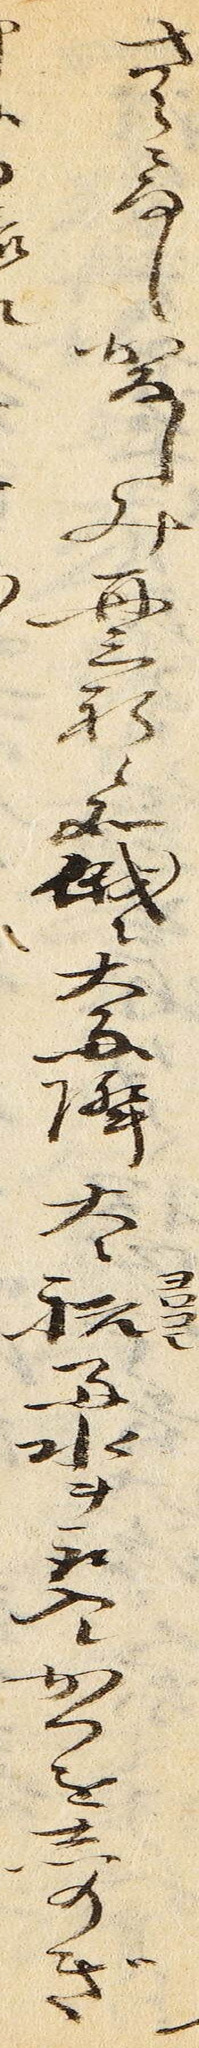さらになしかなしみ再三祈候処俄に大雨降大に祝雨水を取入れかつをしのぎ
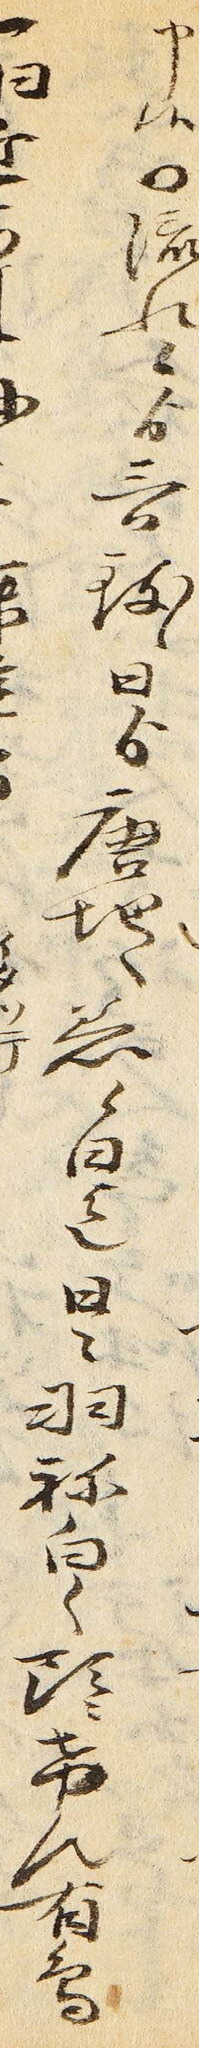申候○流れ候ゟ三日致候日ゟ唐地へ着候日迄日々羽ね白く頭にけん有鳥
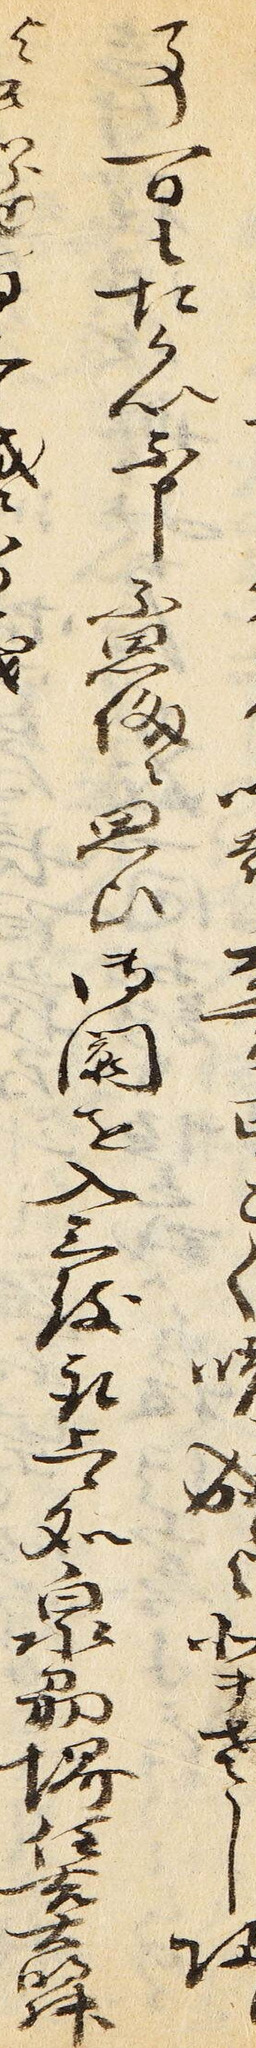事一日もたかひ不申不思議に思ひ御鬮を入三度取上候処泉州堺住吉大明神
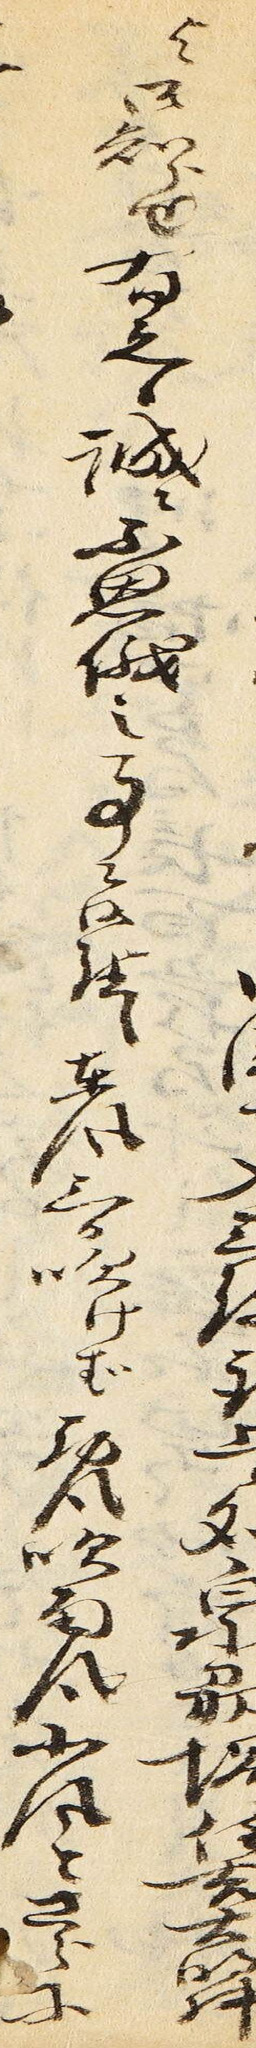と御知らせ有之候誠に不思議之事に御座候東風三日吹けば西風吹南風北風とさらに
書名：漂流人物語記
